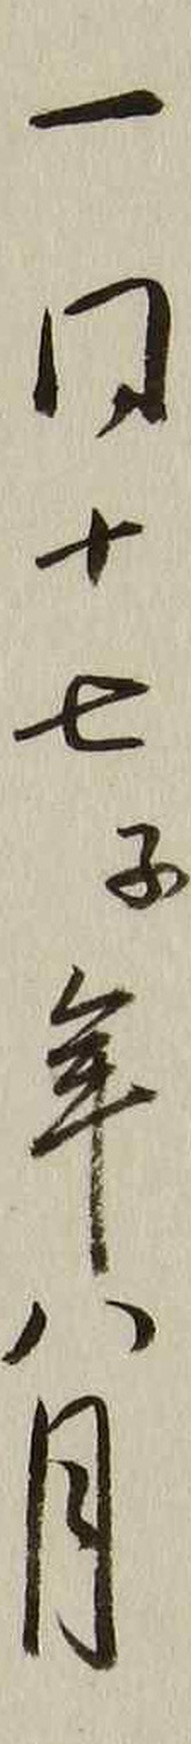一同十七子年八月
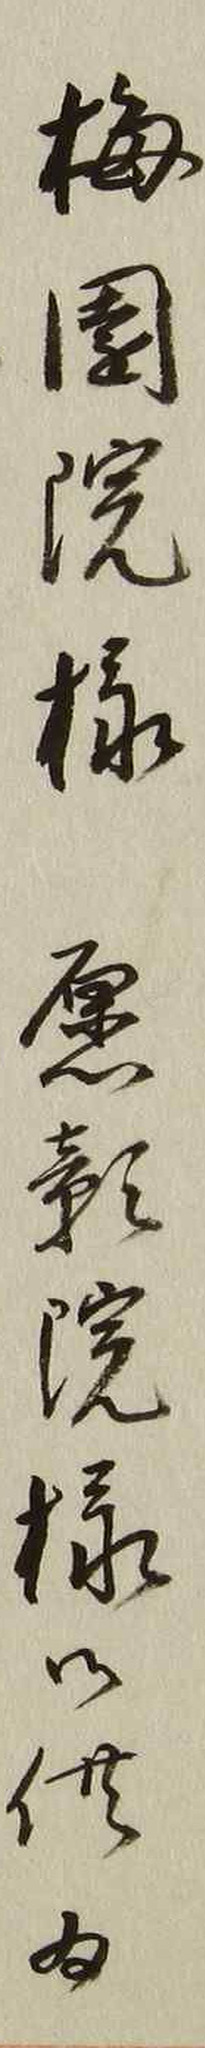梅園院様愿彰院様御供為
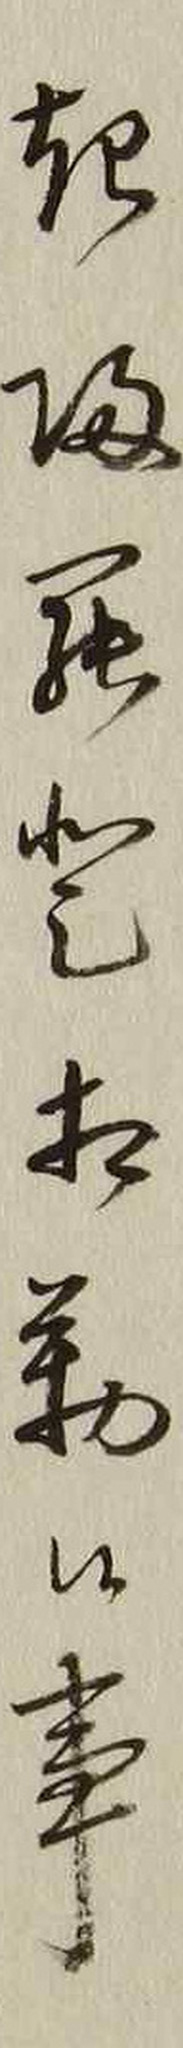起帰罷登相勤候事
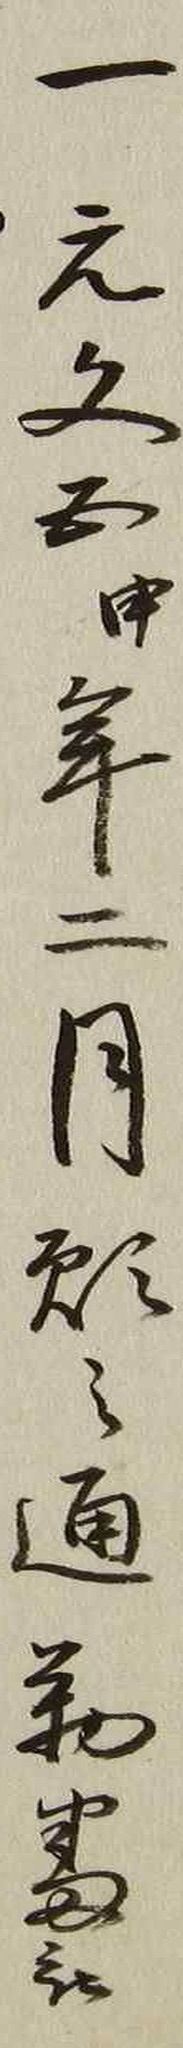一元文五申年二月願之通勤番被
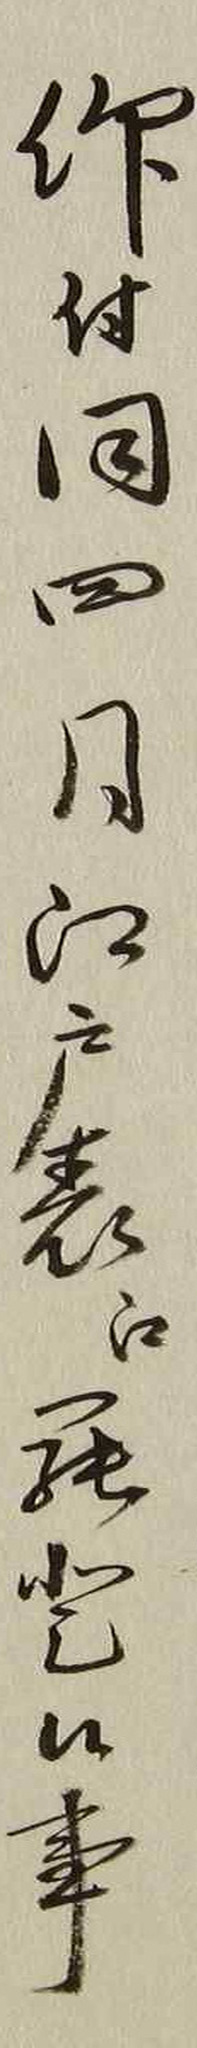仰付同四月江戸表江罷登候事
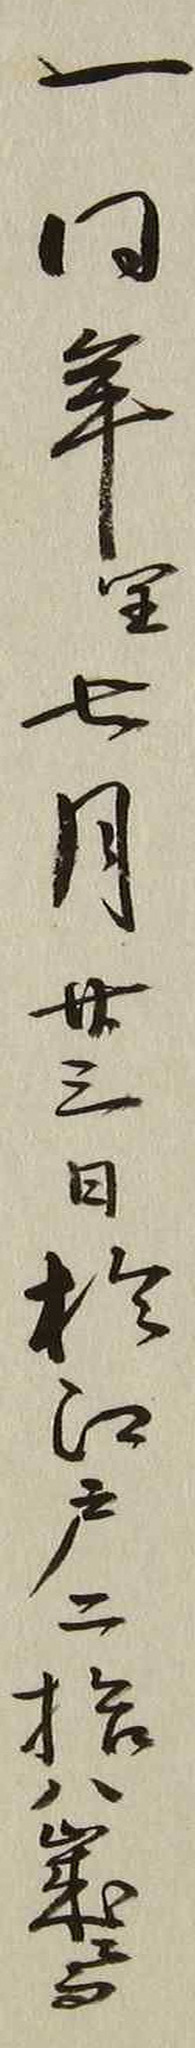一同年閏七月廿三日於江戸二拾八歳ニ而
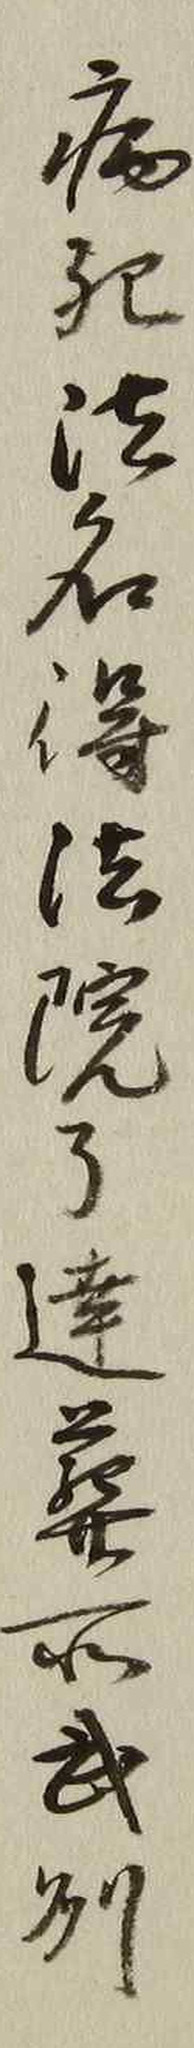病死法名得法院了達葬所武州
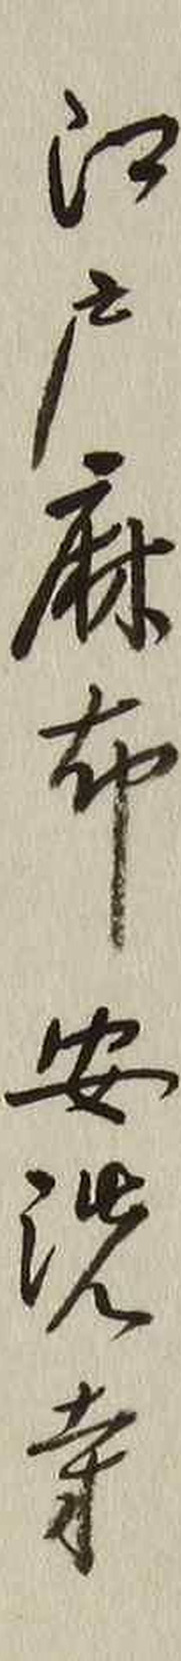江戸麻布安洗寺
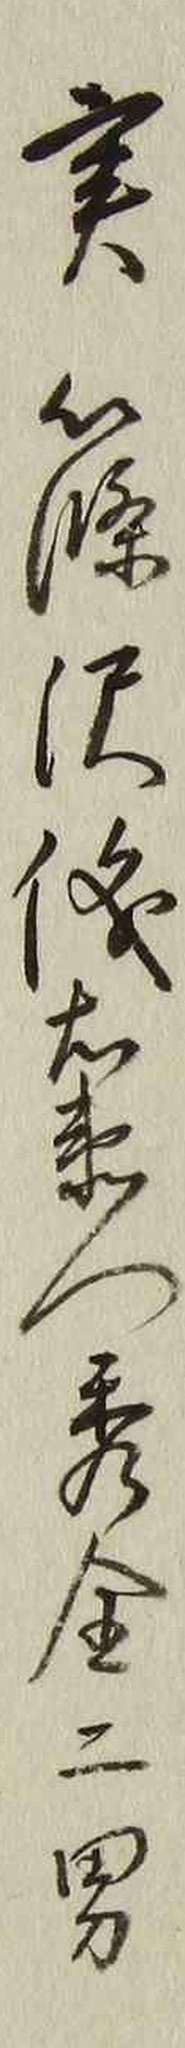実篠沢儀右衛門秀金二男
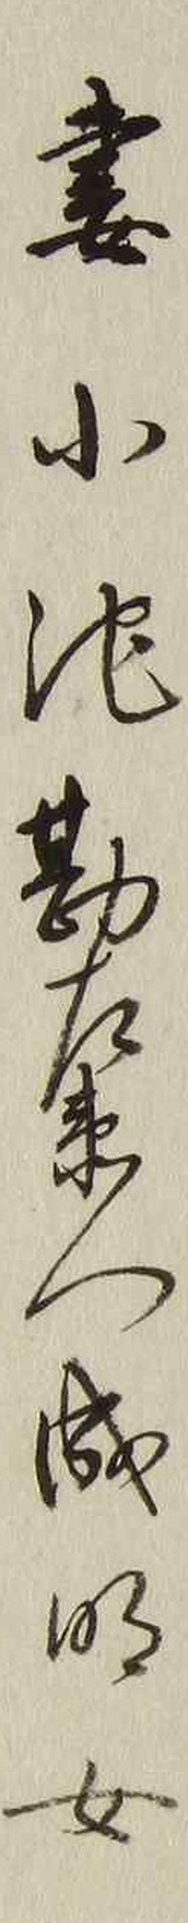妻小池勘左衛門成明女
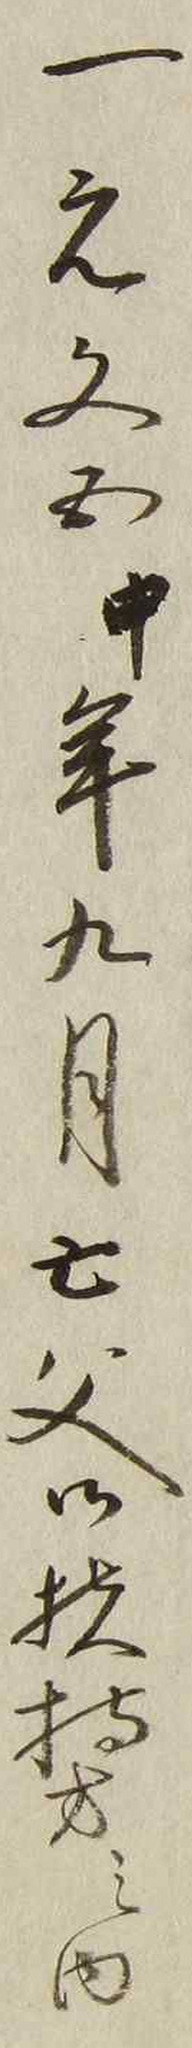一元文五申年九月亡父御扶持方之内

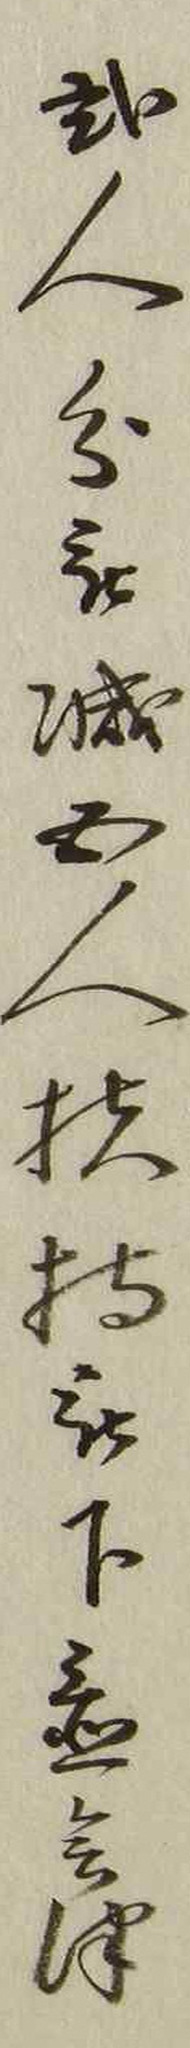弐人分被減五人扶持被下置会津
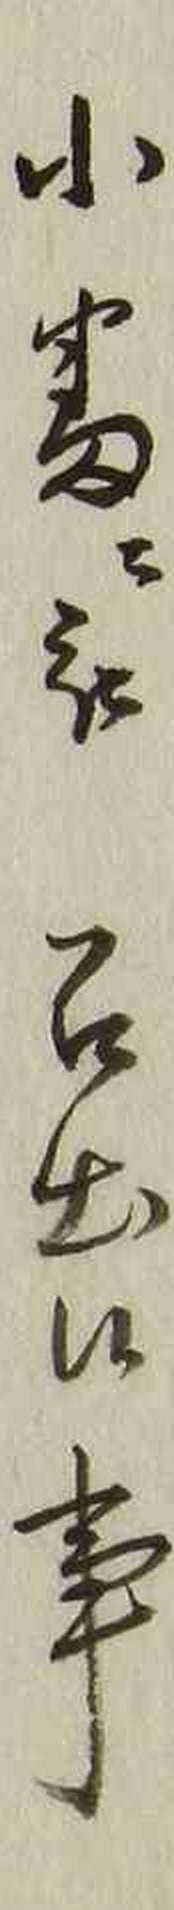小番ニ被召出候事
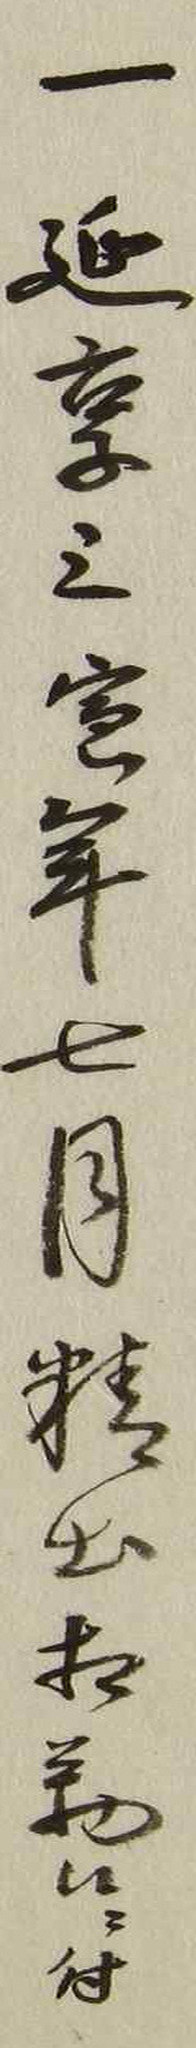一延享三寅年七月精出相勤候ニ付
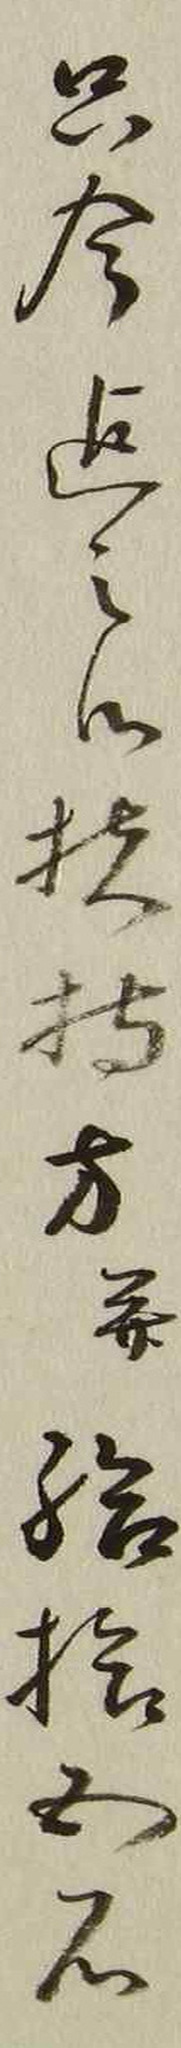只今迄之御扶持方并給拾五石
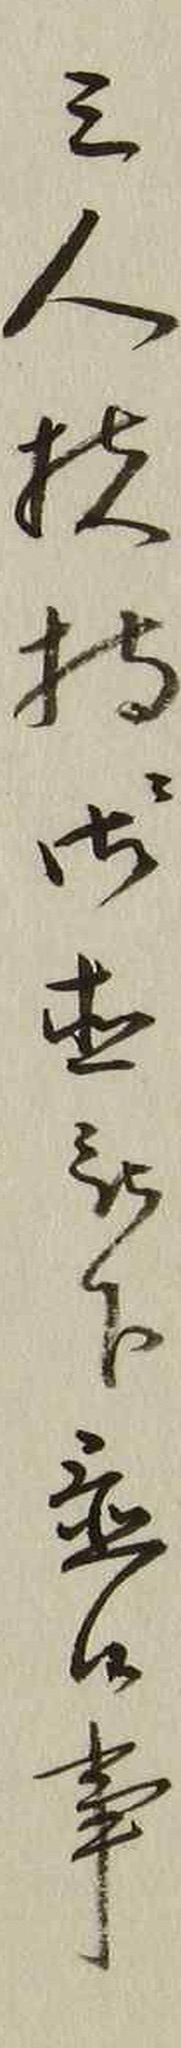三人扶持ニ御直被下置候事
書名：諸士系譜　巻之149　そ之部2
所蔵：会津若松市立会津図書館
